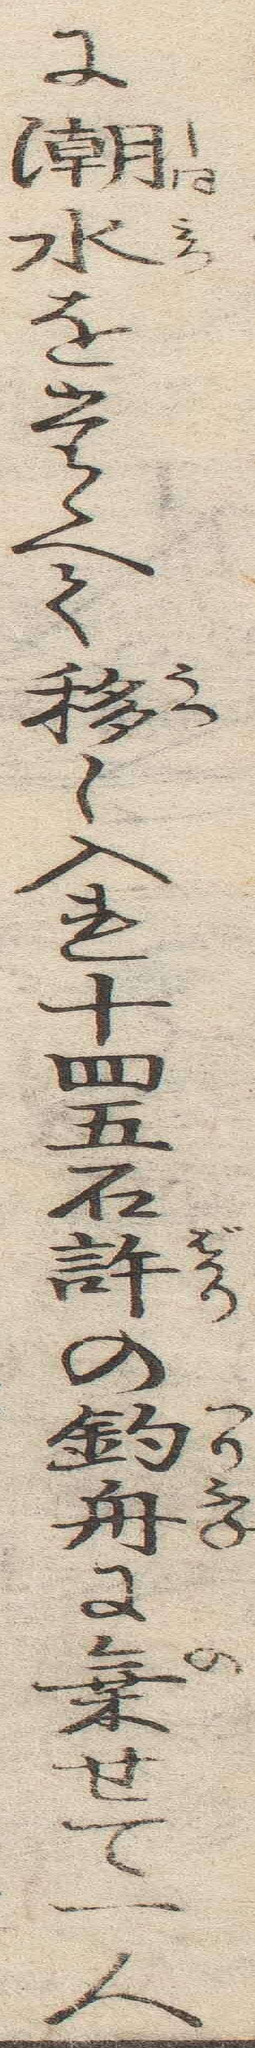に潮水をたゝへて移し入れ十四五石許の釣舟に乗せて一人
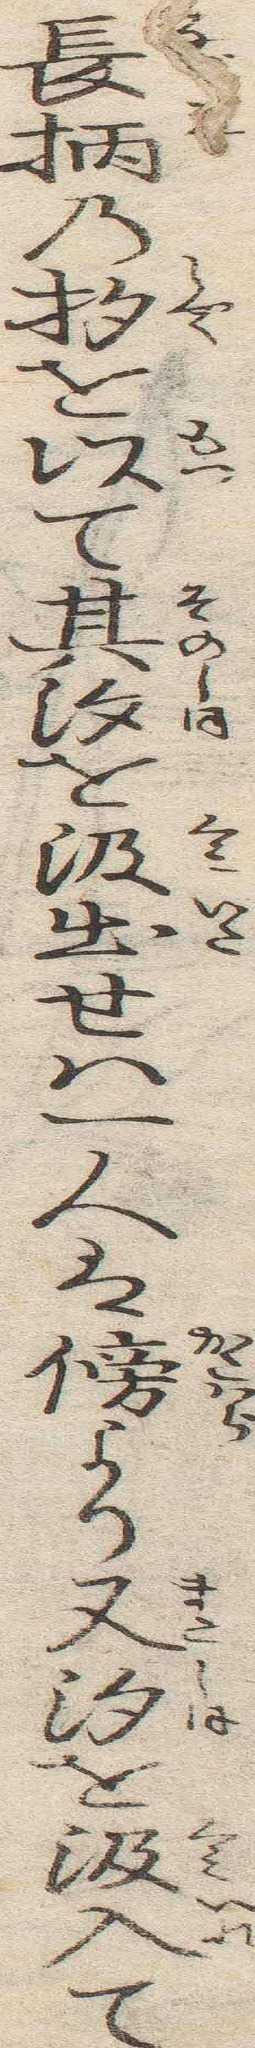長柄の杓を以て其汐を汲出せは一人は傍より又汐を汲入て
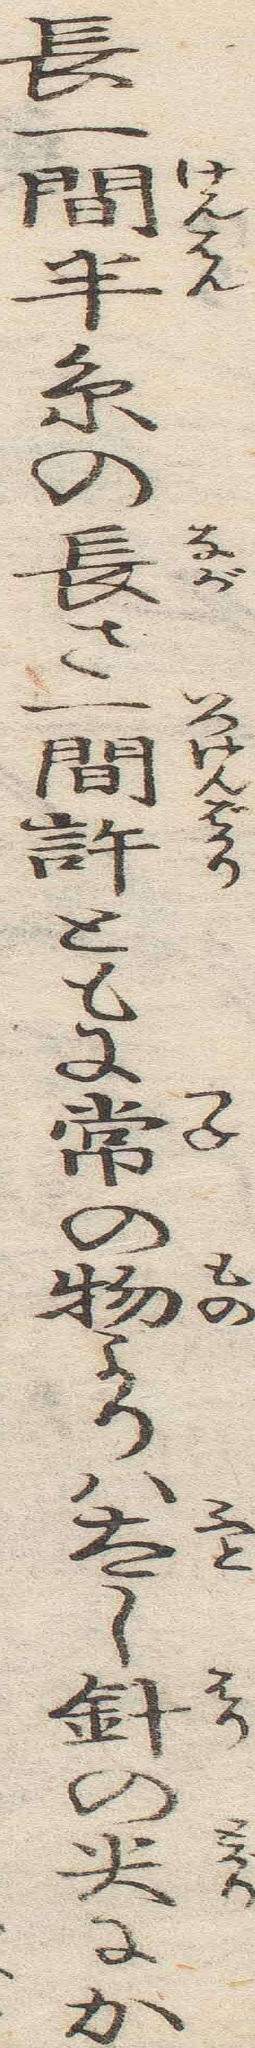長一間半糸の長さ一間許ともに常の物よりは太し針の尖にか
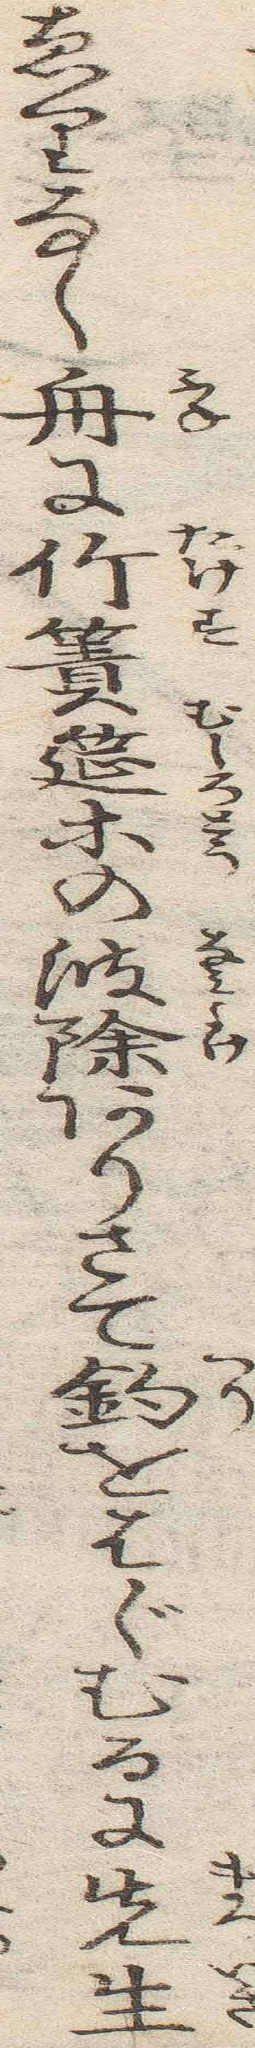ゑりなし舟に竹簀筵等の波除ありさて釣をはじむるに先生
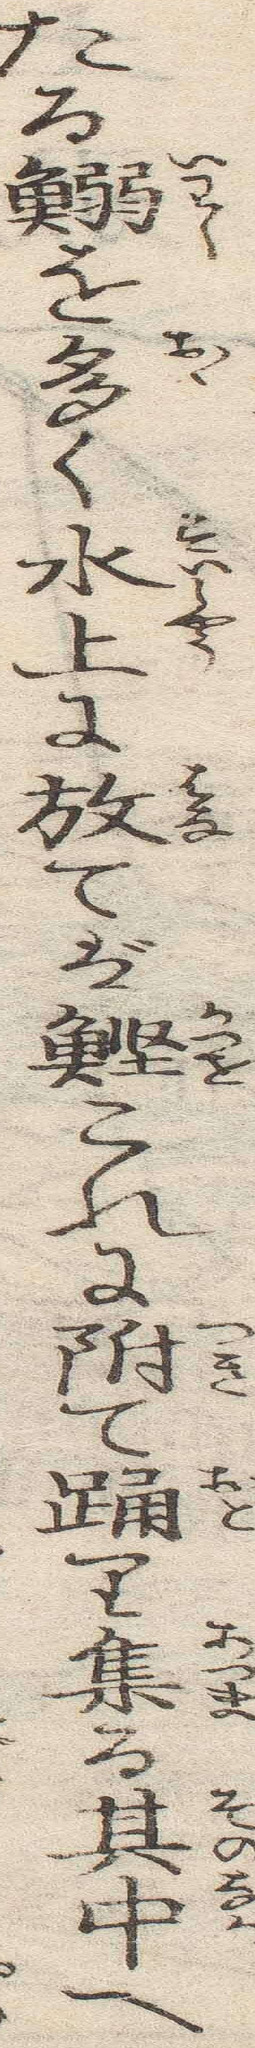たる鰯を多く水上に放てば鰹これに附て踊り集る其中へ
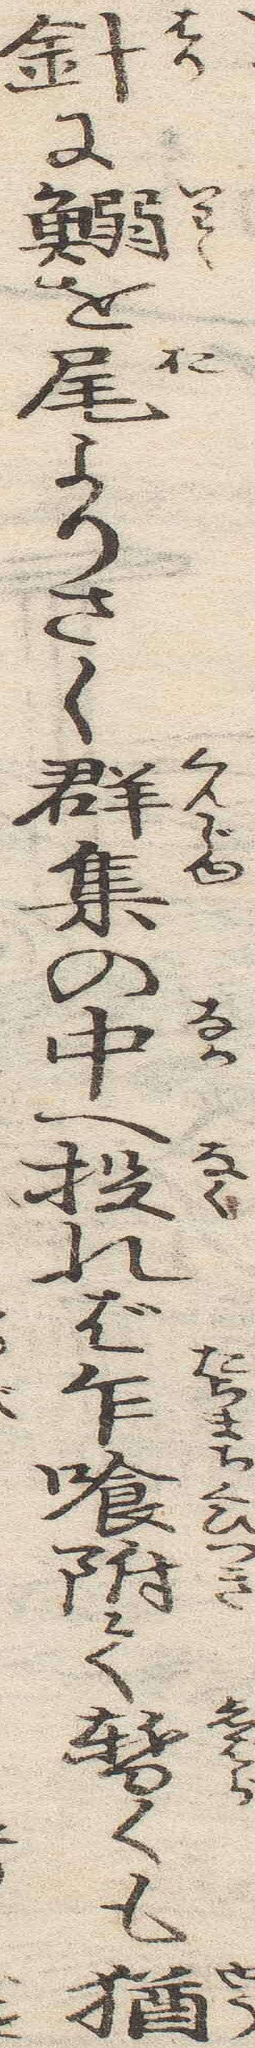針に鰯を尾よりさし群集の中へ投れば乍喰附て暫くも猶
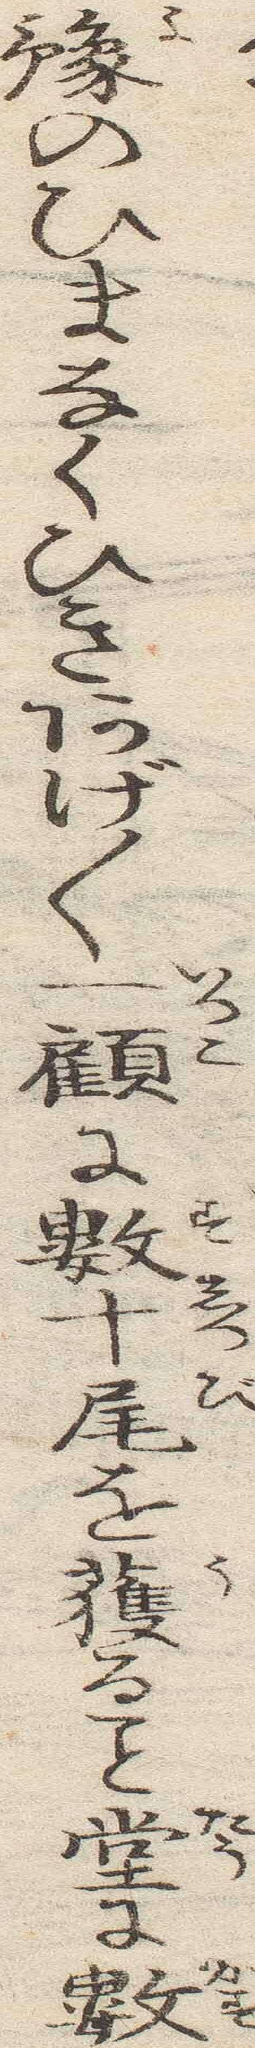予のひまなくひきあげ〳〵一顧に数十尾を獲ること堂に数
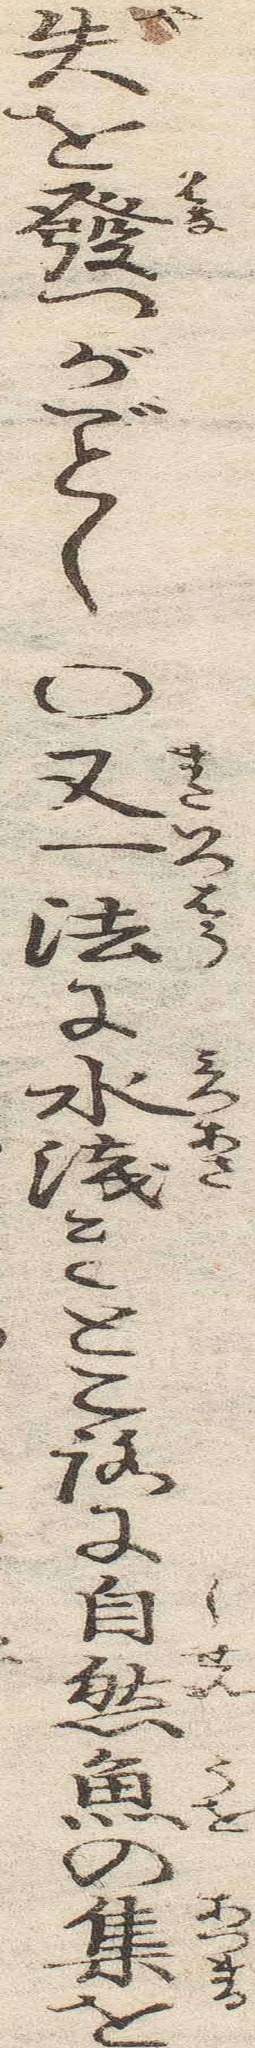矢を発つがごとし○又一法に水浅きところに自然魚の集を
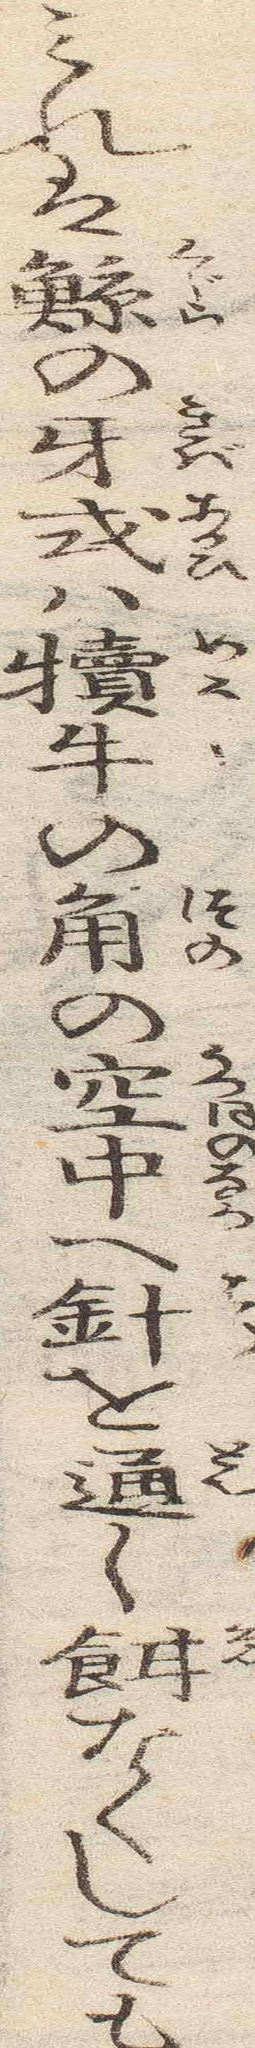みれは鯨の牙或は犢牛の角の空中へ針を通し餌なくしても
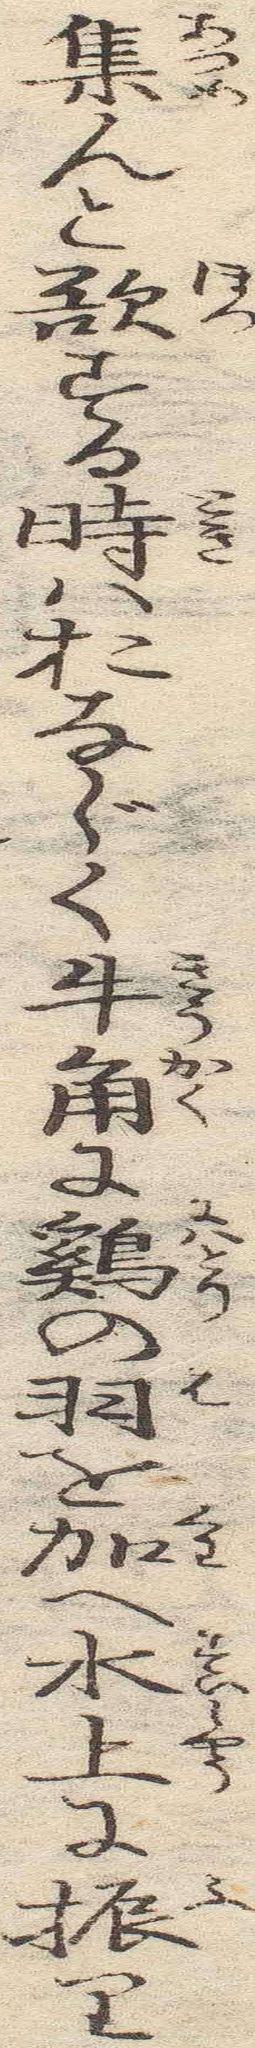集んと欲する時はおなじく牛角に鶏の羽を加へ水上に振り
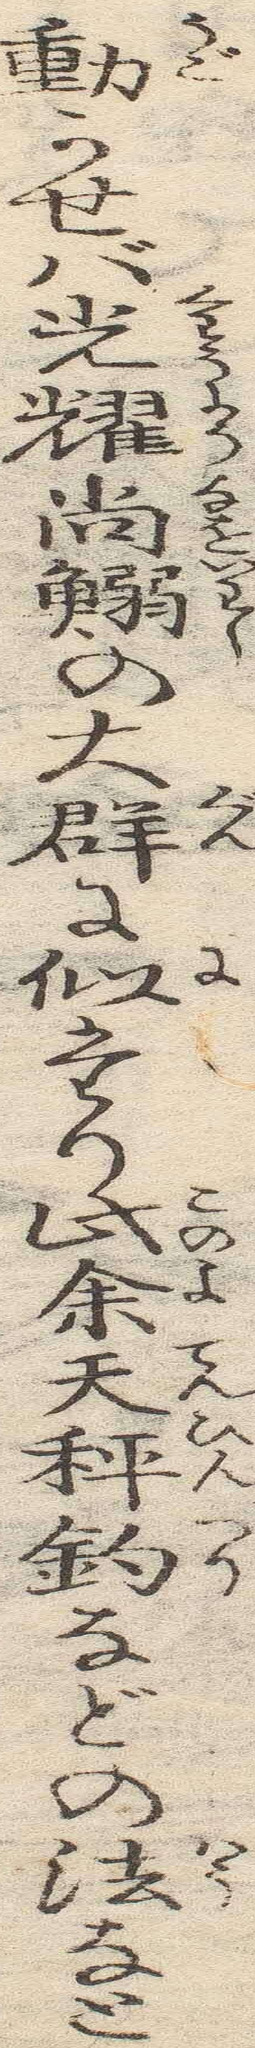動かせば光耀尚鰯の大群に似たり此余天秤釣などの法なと
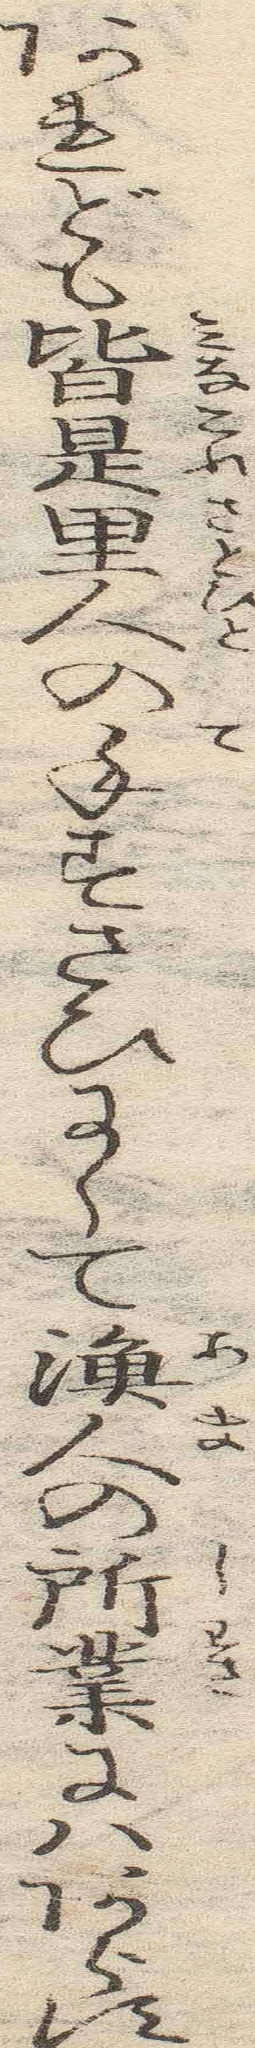あれども皆是里人の手すさひにして漁人の所業にはあらす
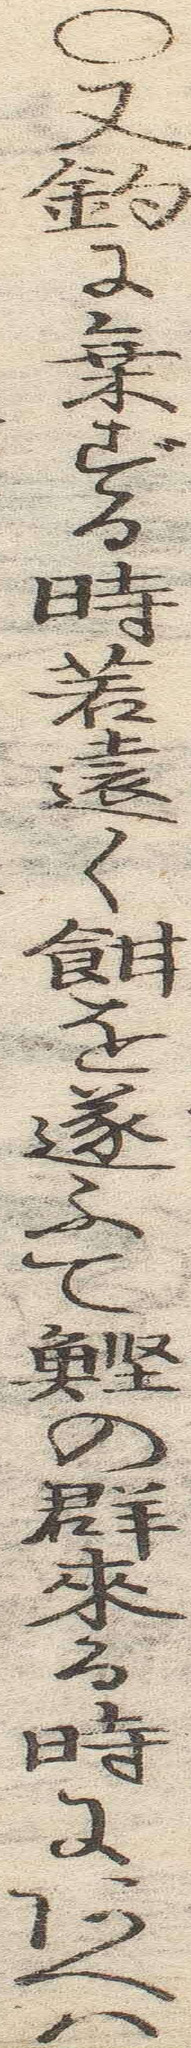○又釣に乗ずる時若遠く餌を遂ふて鰹の群来る時にあへは
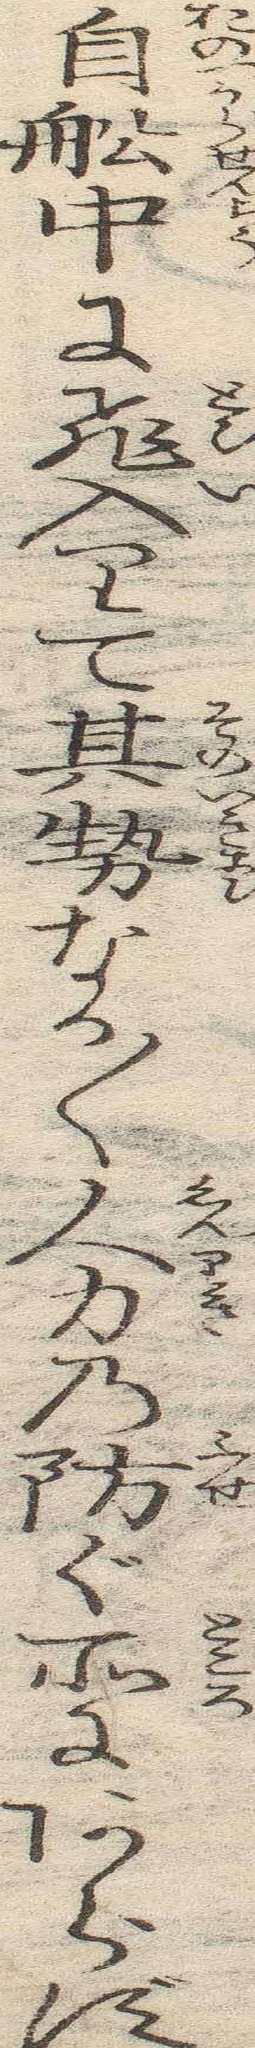自船中に飛入りて其勢なか〳〵人力の防ぐ所にあらず
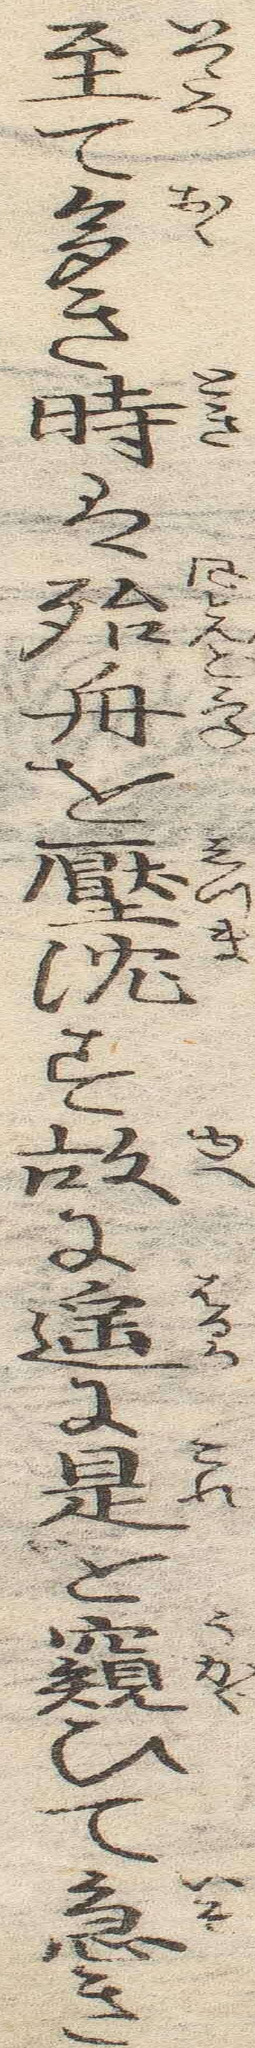至て多き時は殆舟を圧沈す故に遥に是を窺ひて急き
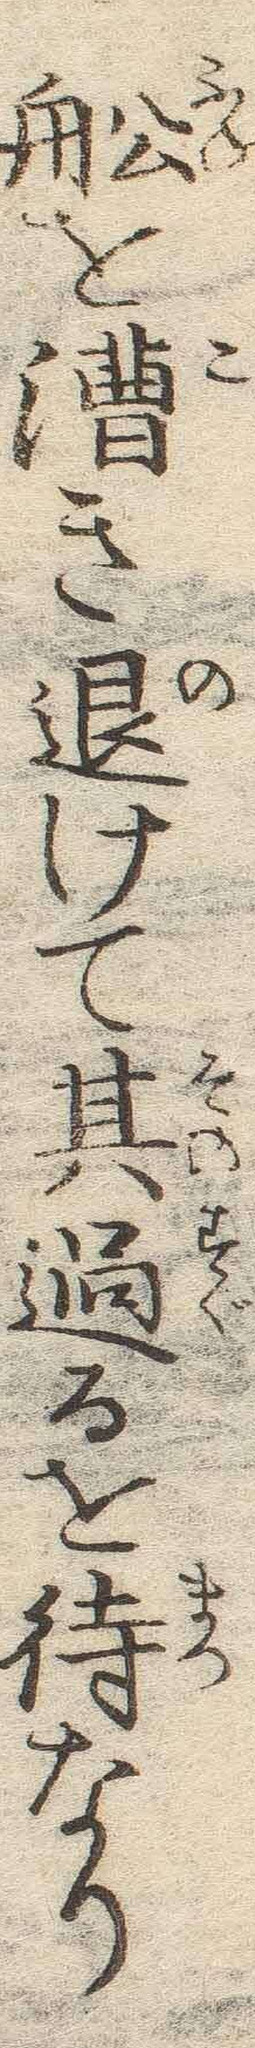船を漕き退けて其過るを待なり
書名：日本山海名産図会
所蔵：東京学芸大学附属図書館 国文学研究資料館
